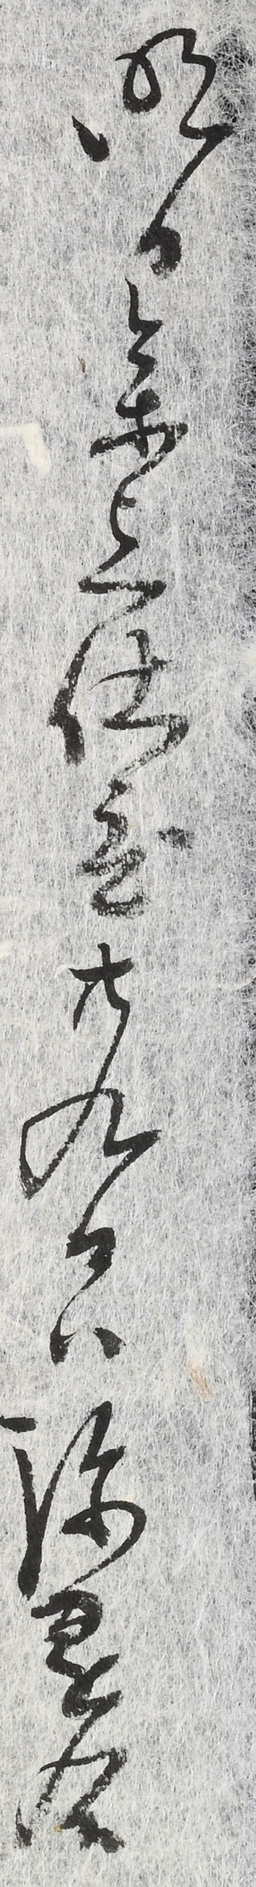明日参上仕度廿九日ハ弥懸合
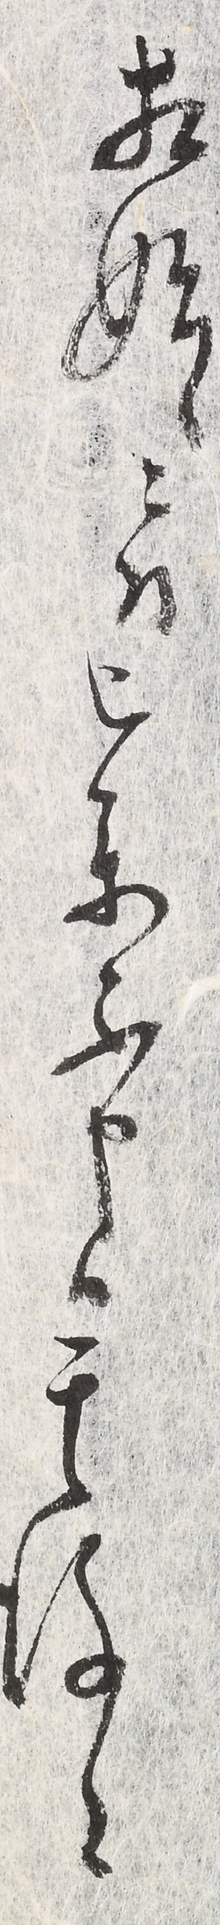相始候ニ付被参不申候其後ニ
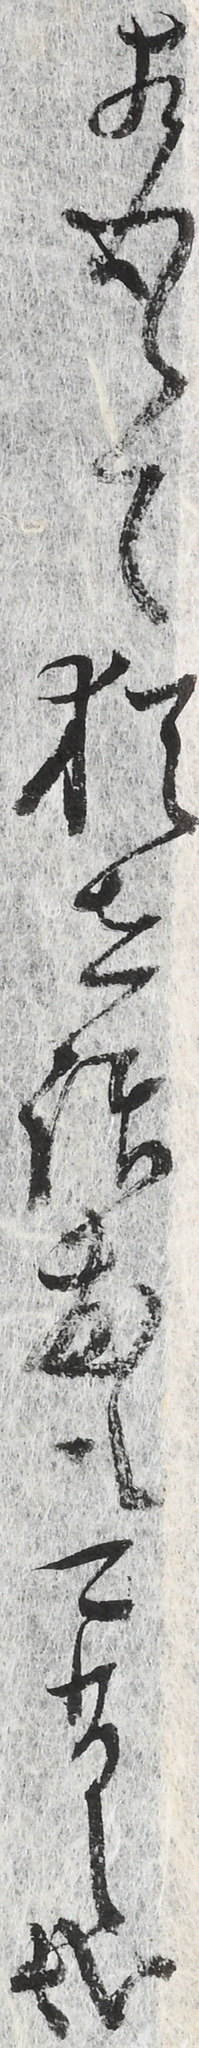相成候ハヽ猶世話敷も可有之哉
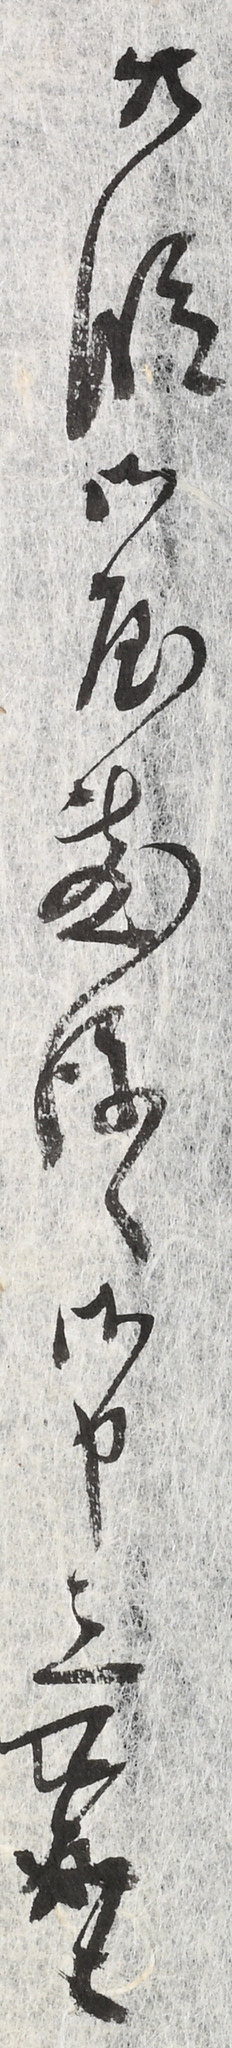此段御屋敷様へ御申上可被成候
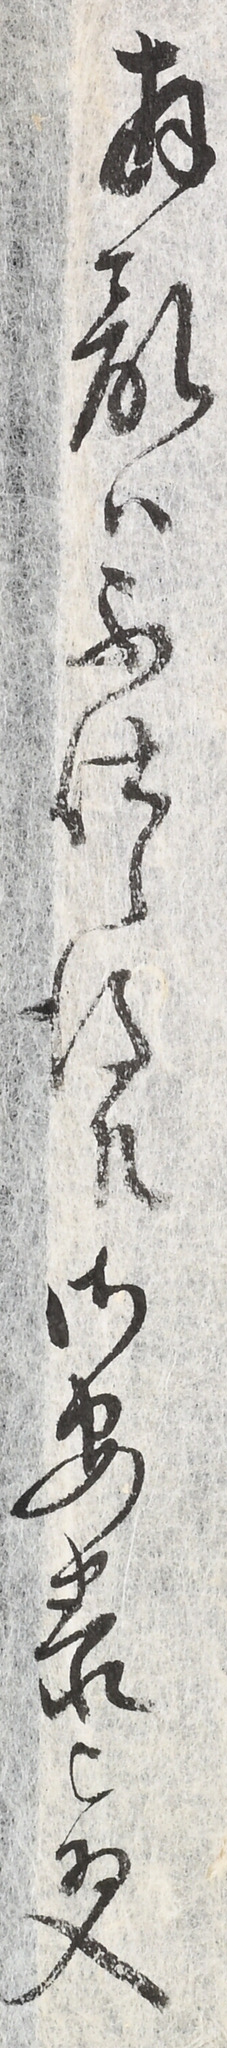拝顔ハ不仕候得共御安泰為入
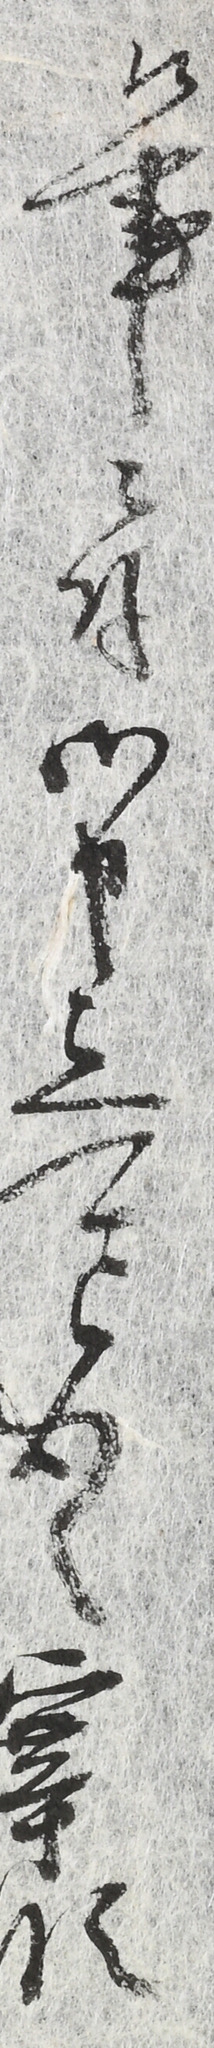候事ニ付御申上可被成候宰領

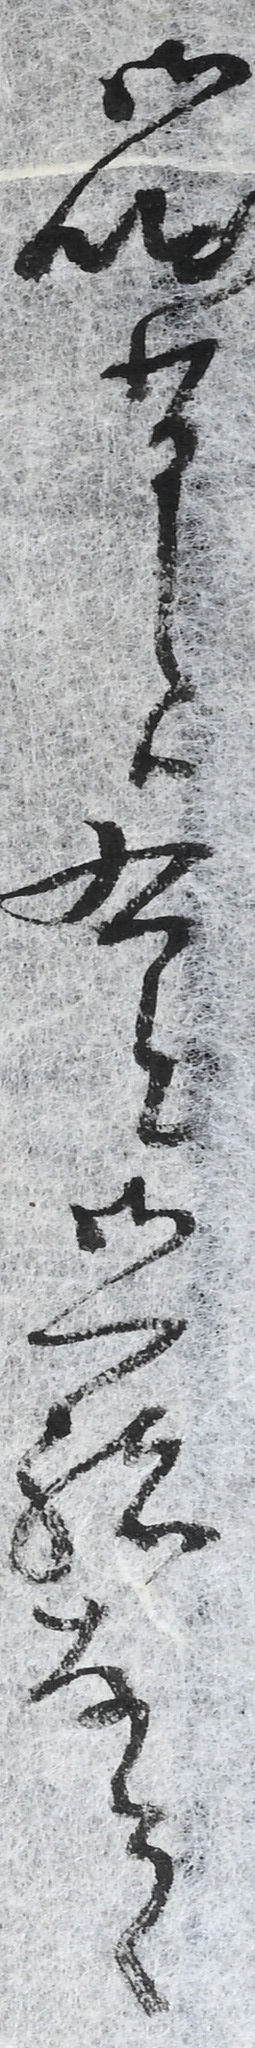御咄有之候右ニ御一緒なとゝ
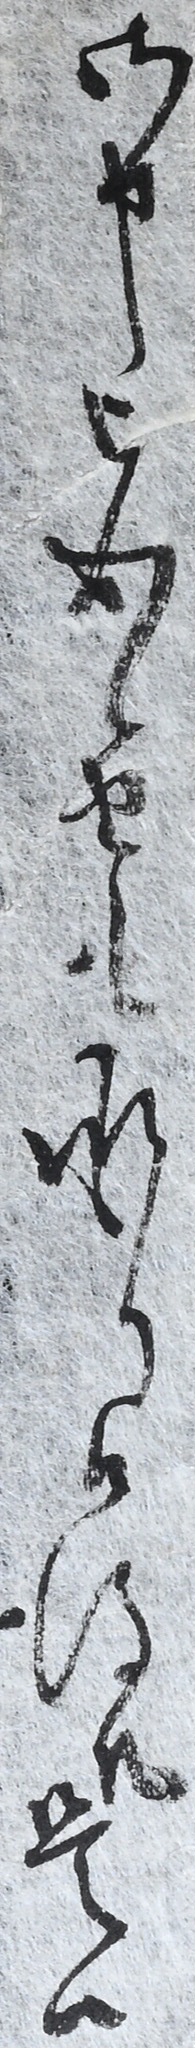御申被成候由も承り候得共是ハ
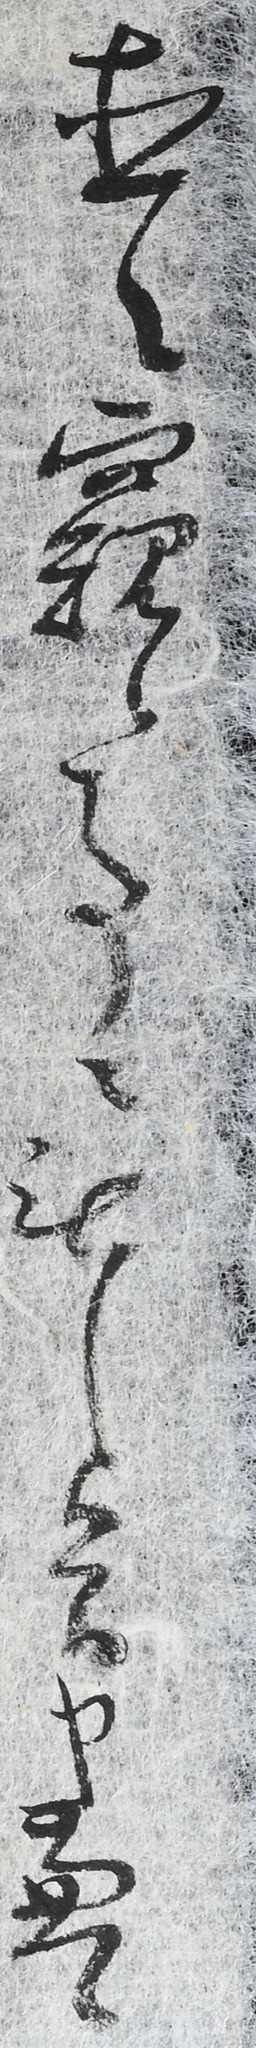直ニ窺候事ニ無之候間申兼候
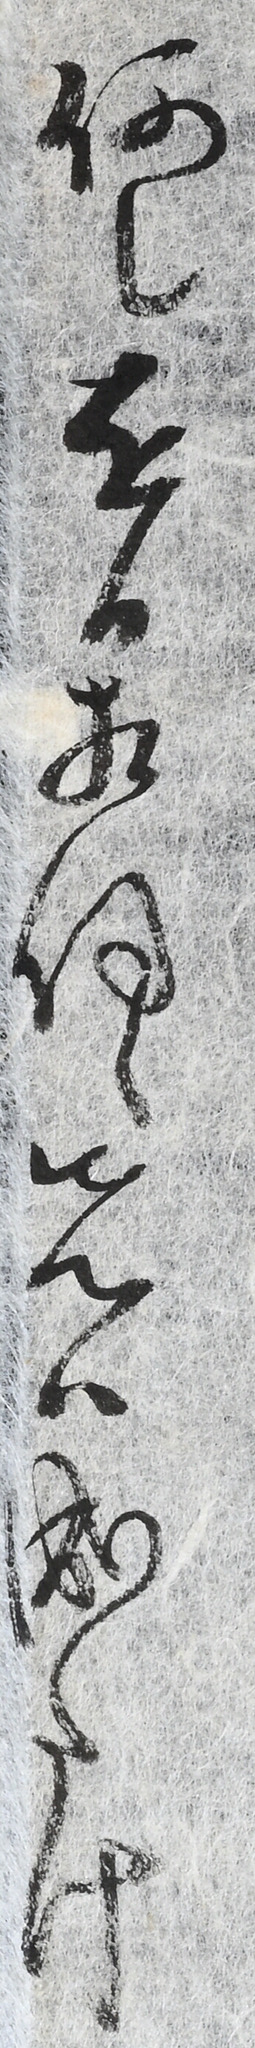何レ近日相伺候先ハ成たけ
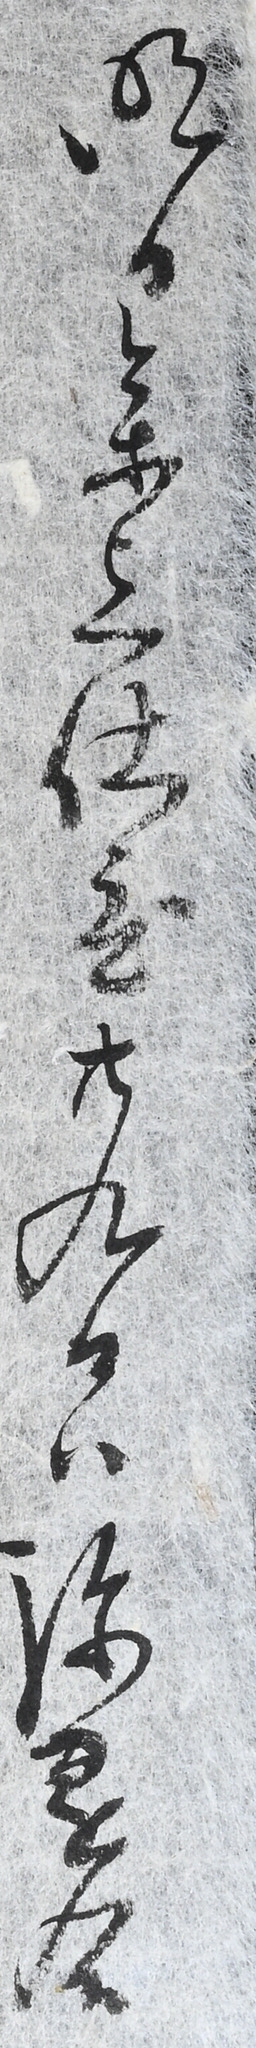明日参上仕度廿九日ハ弥懸合
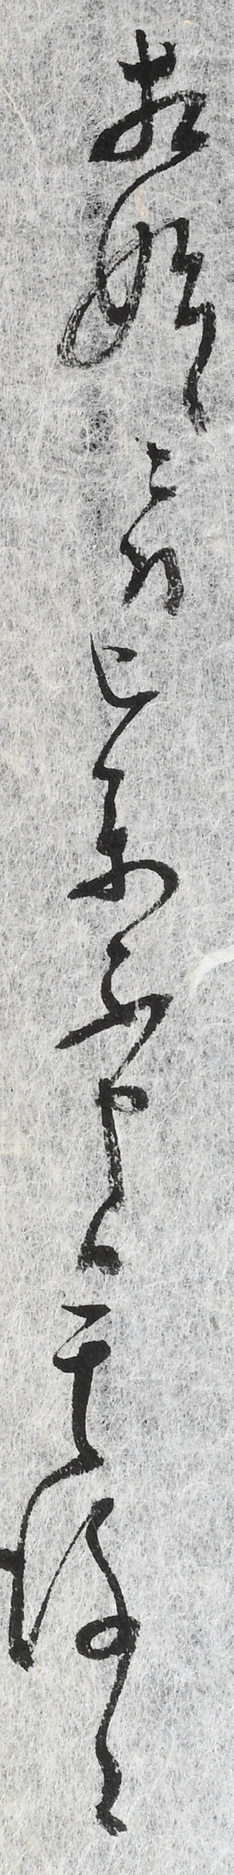相始候ニ付被参不申候其後ニ
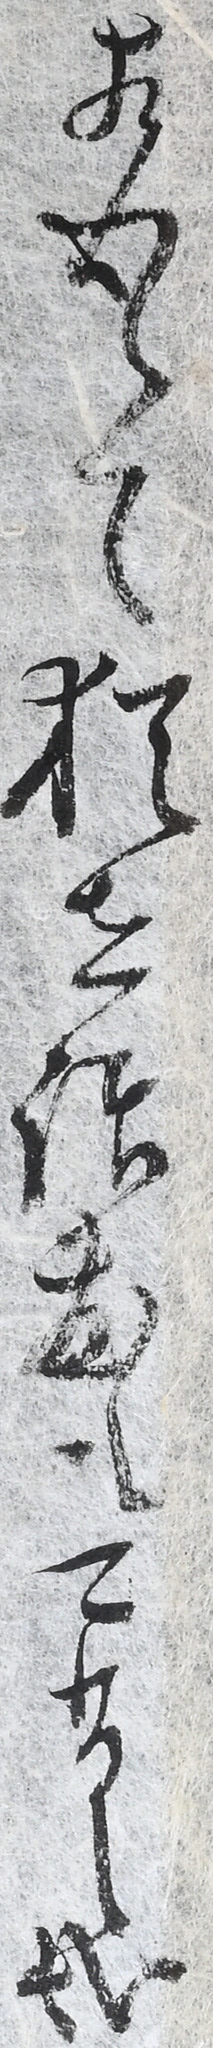相成候ハヽ猶世話敷も可有之哉
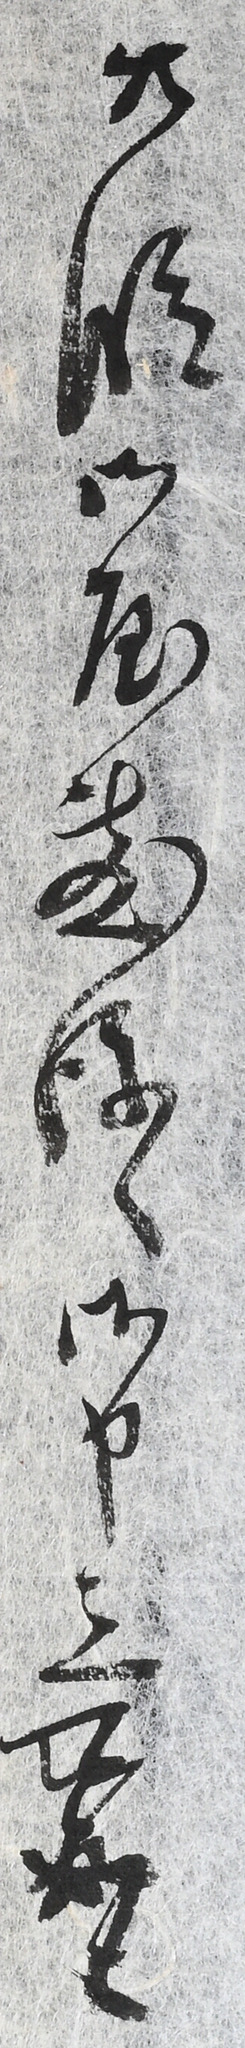此段御屋敷様へ御申上可被成候
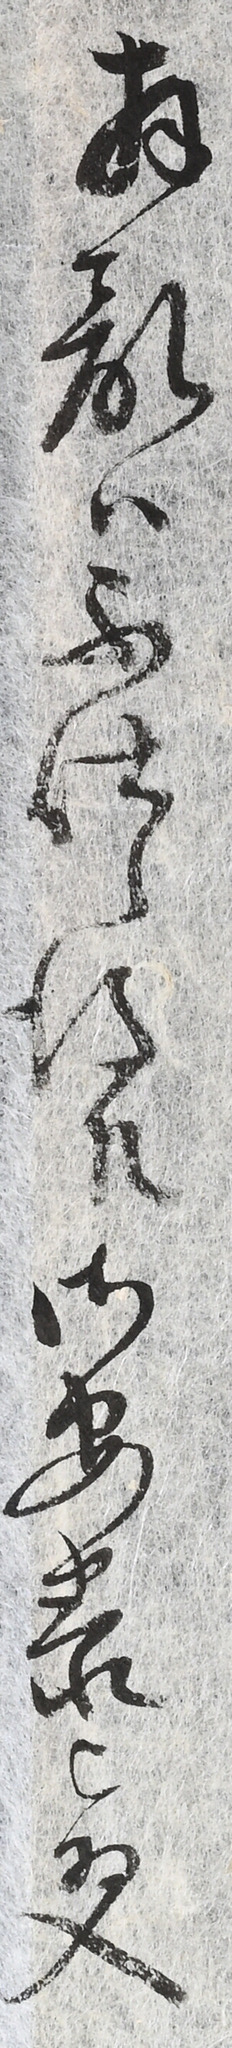拝顔ハ不仕候得共御安泰為入
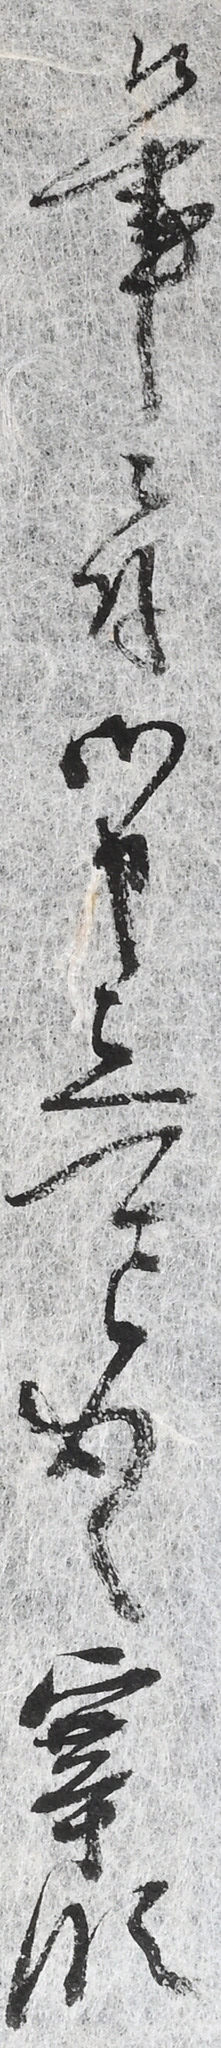候事ニ付御申上可被成候宰領
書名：（書状）
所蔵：伊那市立高遠町図書館・合同会社AMANE
